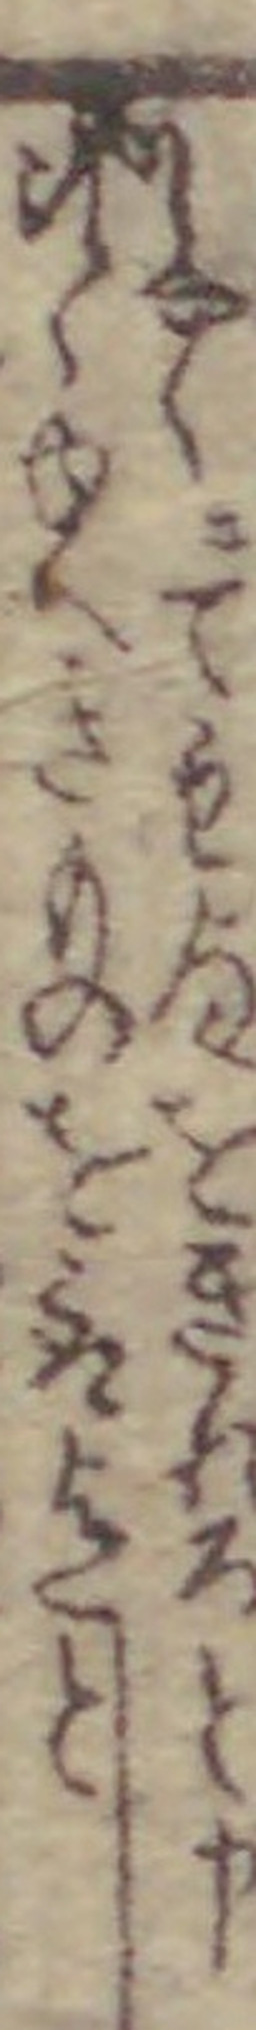参らせ候ゆへきものを取迄と
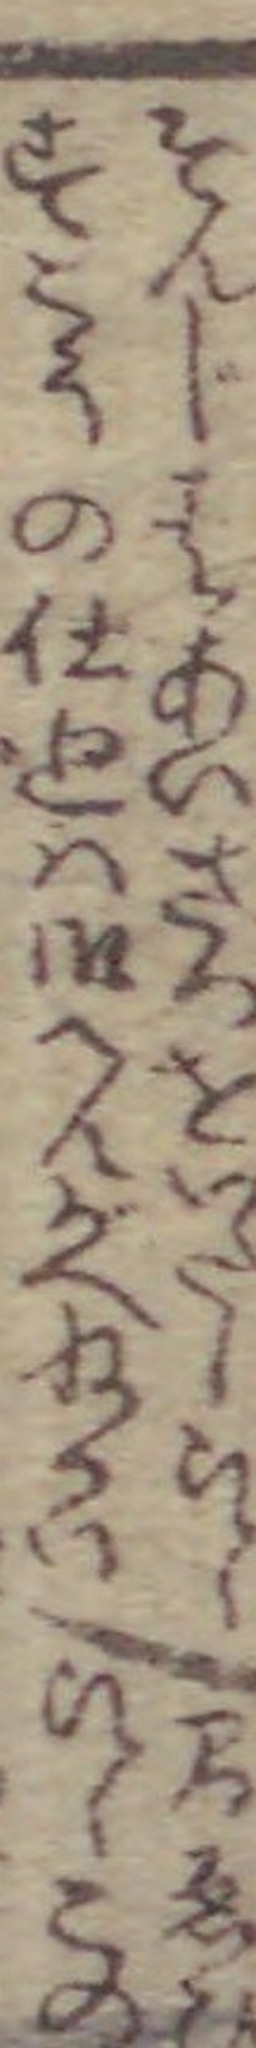すこうの仕廻は御へんがへねかい参らせ候この
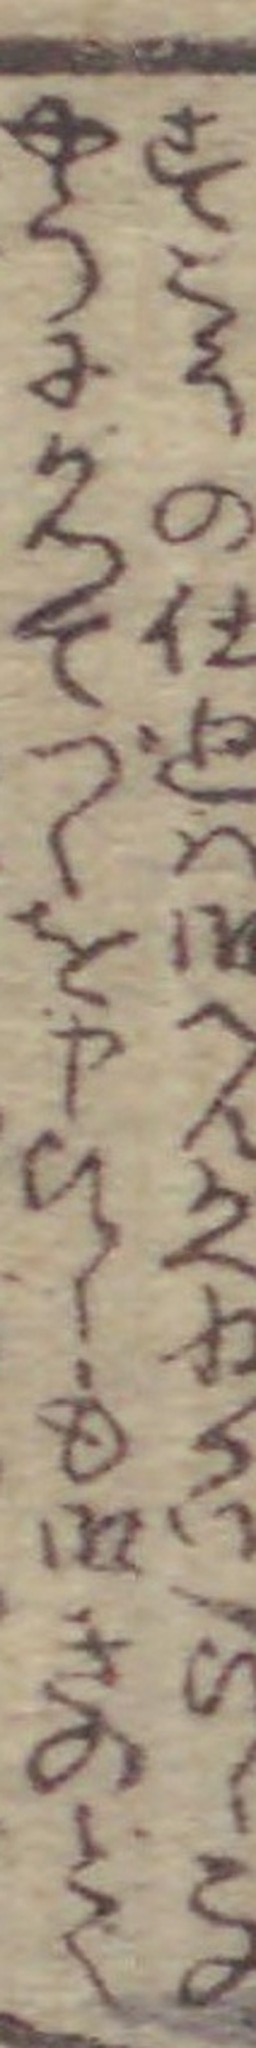やうにかつてづくを申参らせ候も御きのどく
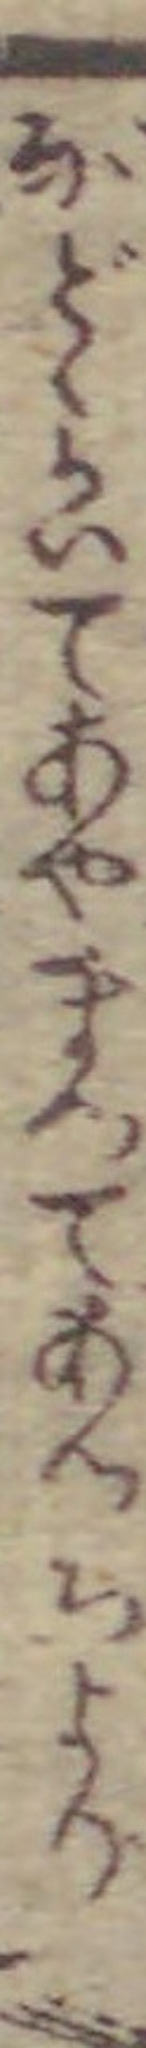などゝかいてあやまつてあつちより
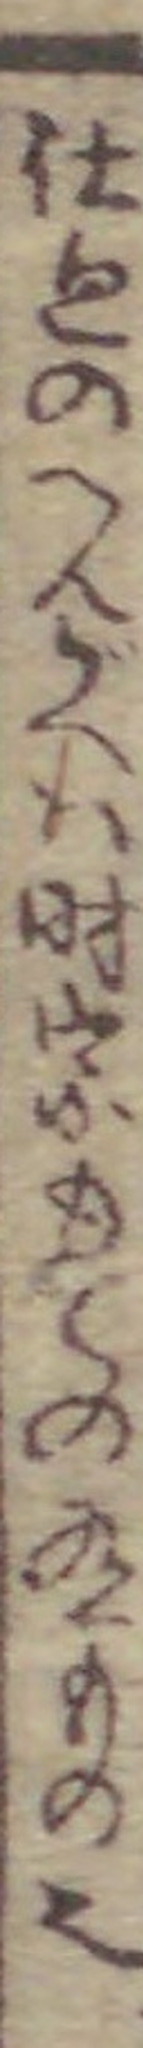仕廻のへんがへは時宗もての有もの也

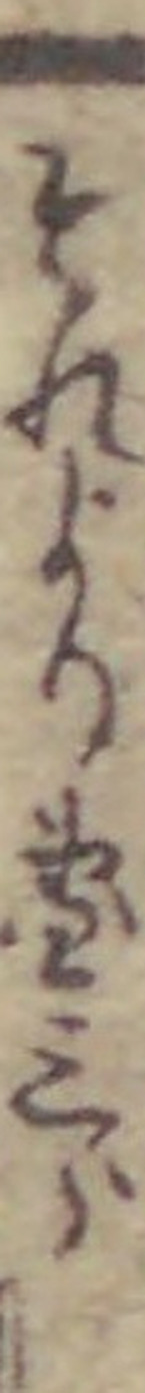それより団三郎
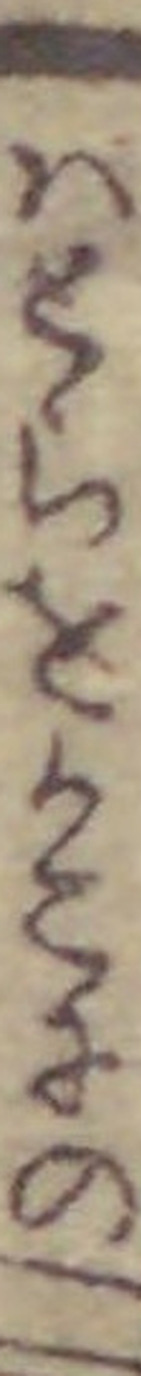はとらをかこにの
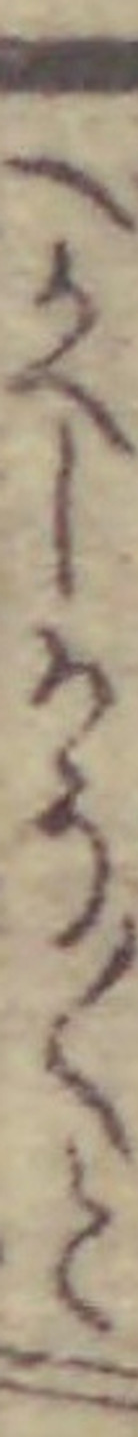へかへしろう〳〵と
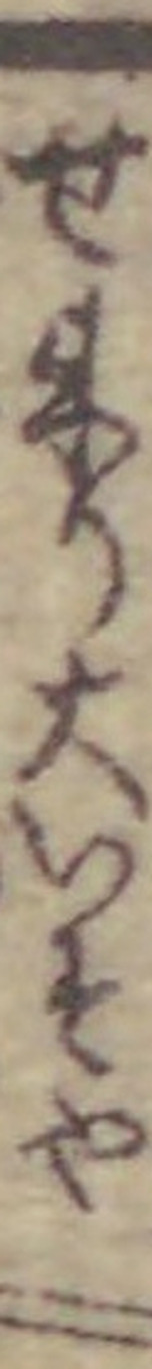せ来り大いそや
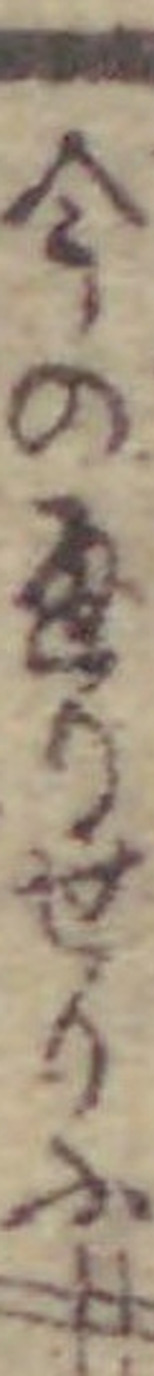今の通りせりふ
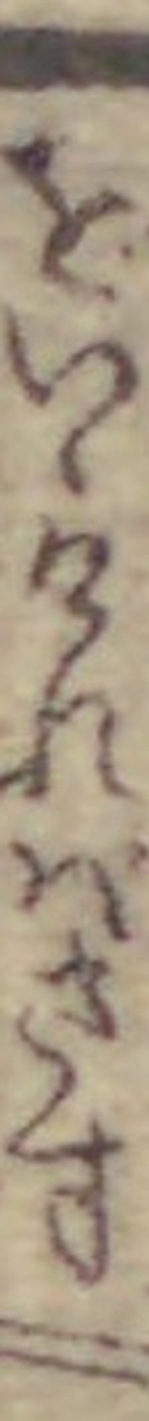をいゝければさす
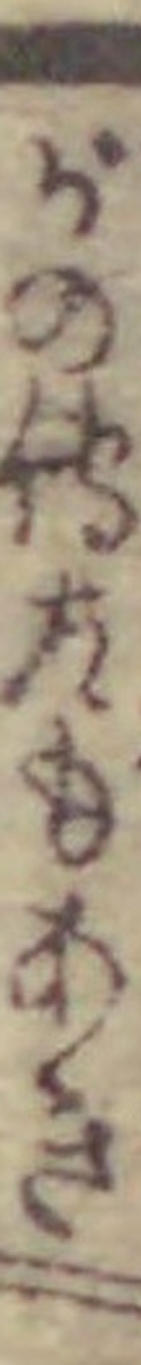がの傳左もあき
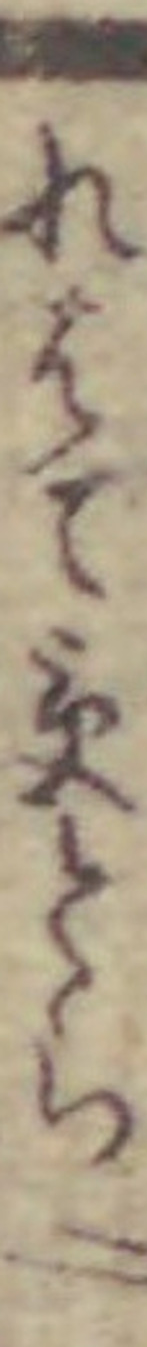れはて受とら
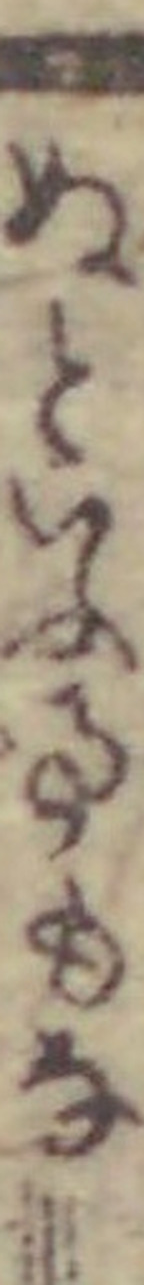ぬといふ事もな
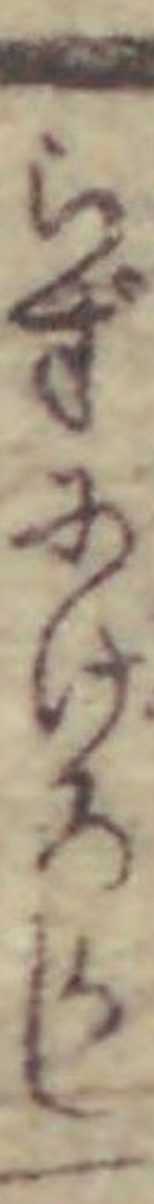らずにげろかし
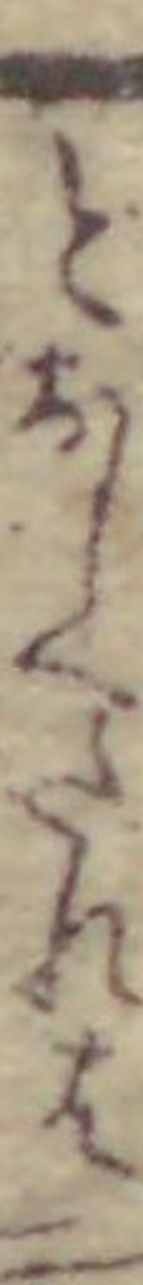とおしへたれは
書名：間似合嘘言曽我 3巻
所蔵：国立国会図書館 National Diet Library, JAPAN
